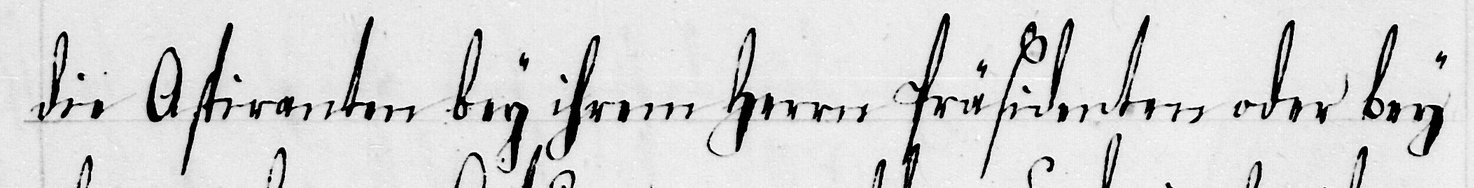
die Aspiranten bey ihrem Herrn Präsidenten oder bey
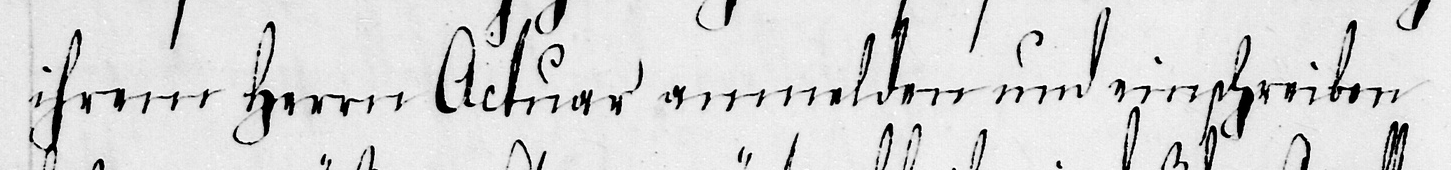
ihrem Herrn Actuar anmelden und einschreiben
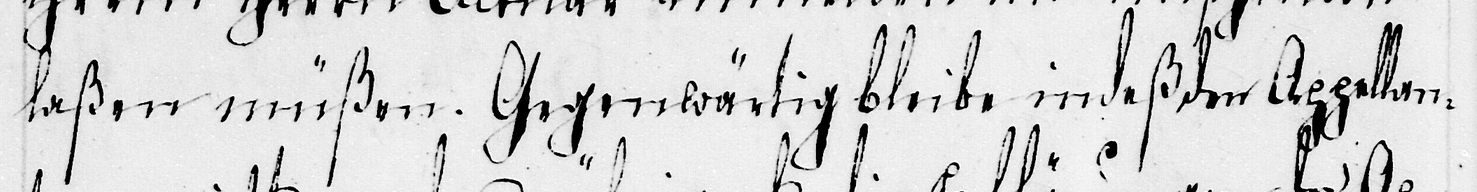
laßen müßen. Gegenwärtig bleibe indeß den Apellan¬
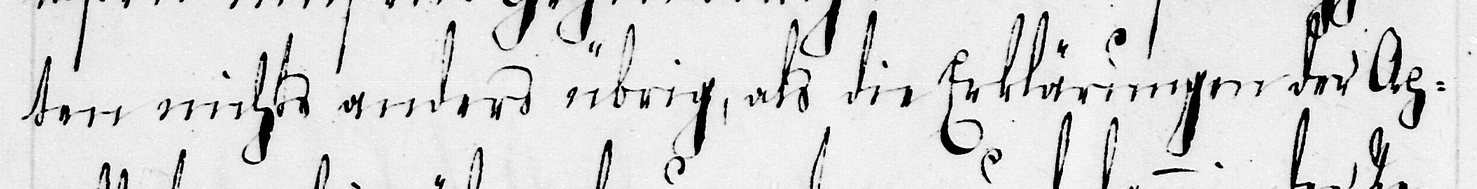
ten nichts anders übrig, als die Erklärungen der Ap¬
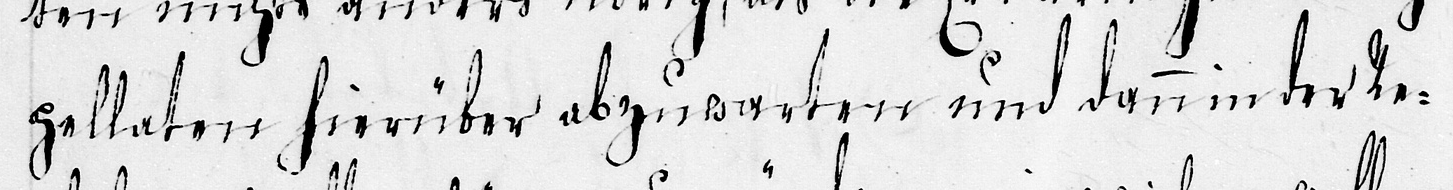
pellaten hierüber abzuwarten und dann in der Re¬
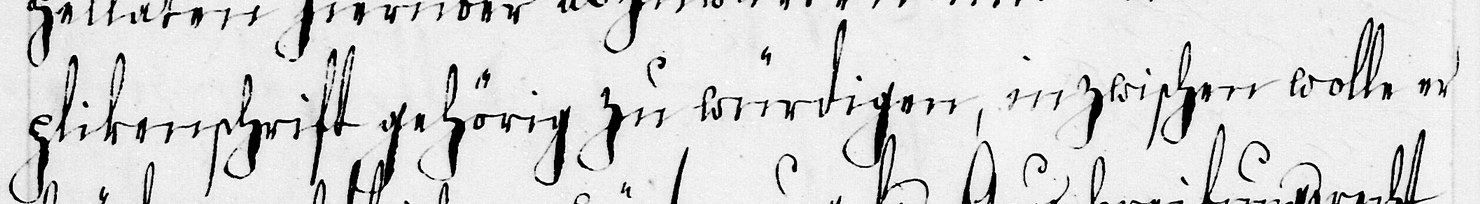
plikenschrift gehörig zu würdigen, inzwischen wolle er
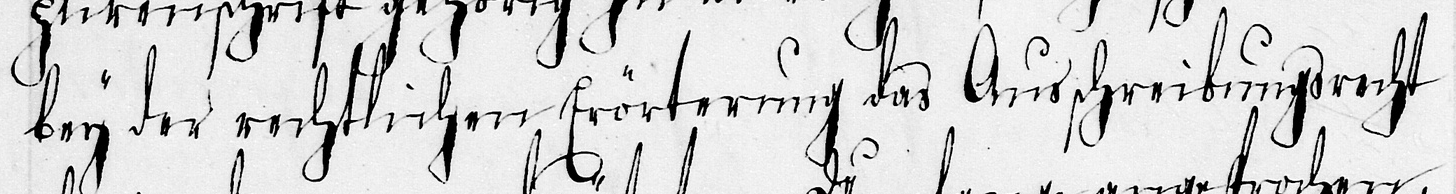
bey der rechtlichen Erörterung das Ausschreibungsrecht
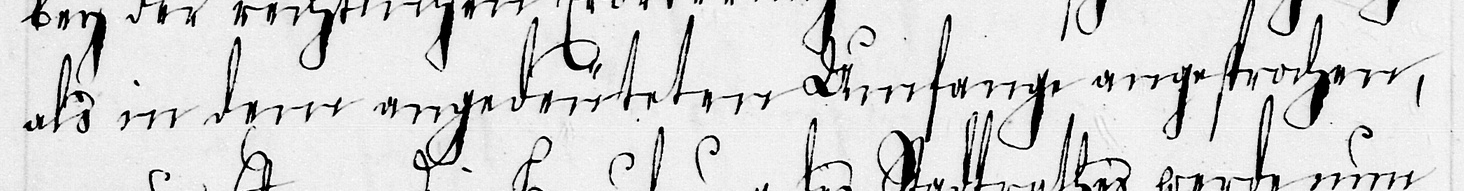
als in dem angedeuteten Umfange angesprochen,
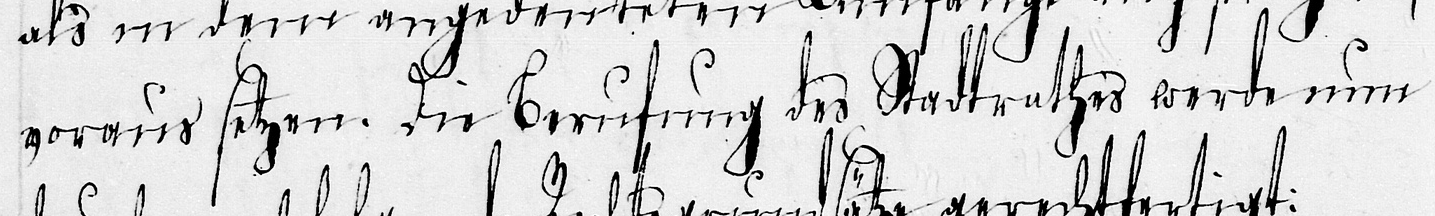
voraus setzen. Die Berufung des Stadtrathes werde nun
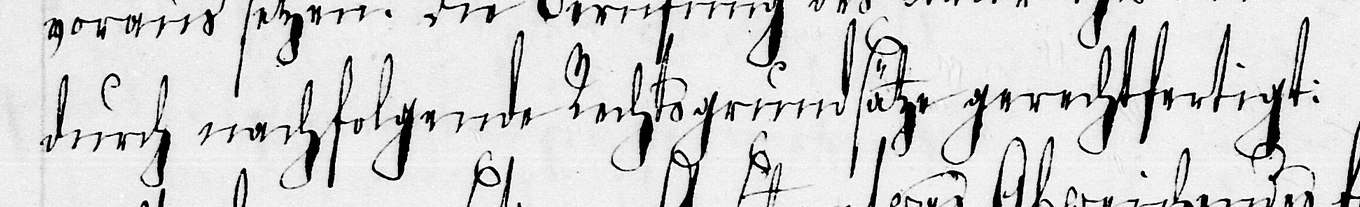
durch nachfolgende Rechtsgrundsätze gerechtfertigt:
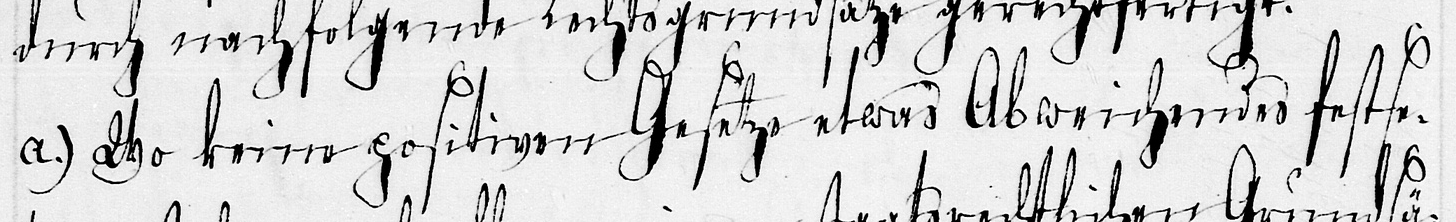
a.) Wo keine positiven Gesetze etwas Abweichendes festse¬
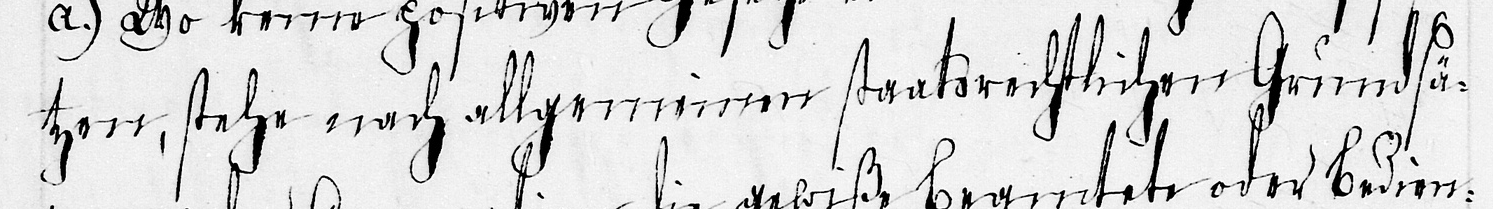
tzen, stehe nach allgemeinen staatsrechtlichen Grundsä¬
